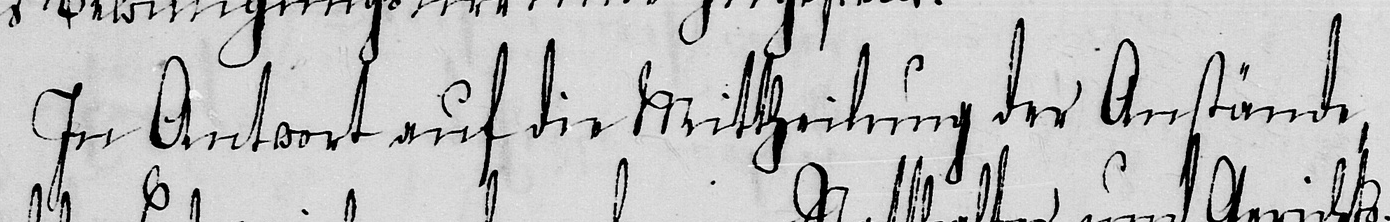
In Antwort auf die Mittheilung der Anstände,
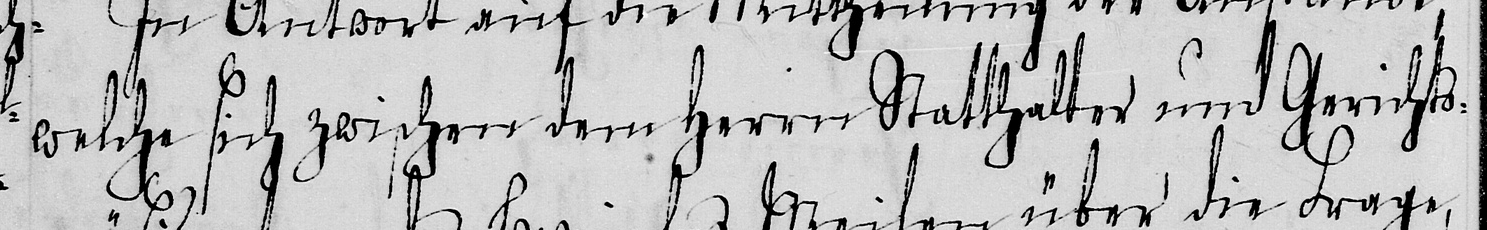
welche sich zwischen dem Herrn Statthalter und Gerichts¬
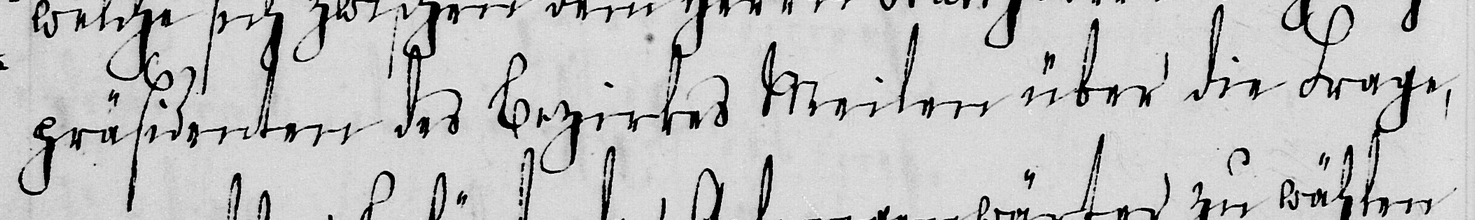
präsidenten des Bezirkes Meilen über die Frage,
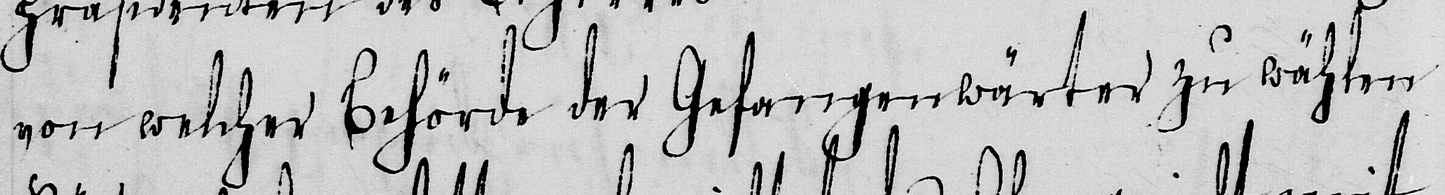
von welcher Behörde der Gefangenwärter zu wählen
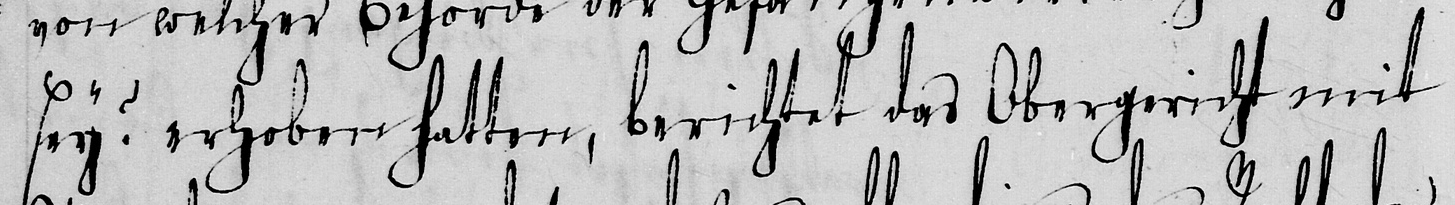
sey? erhoben hatten, berichtet das Obergericht mit
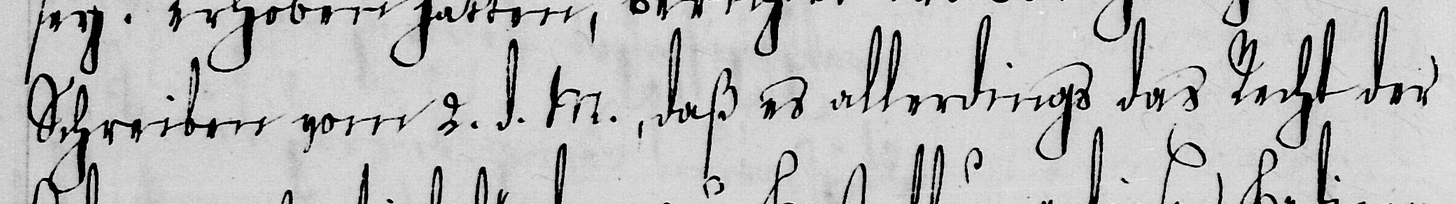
Schreiben vom 2. d. M., daß es allerdings das Recht der
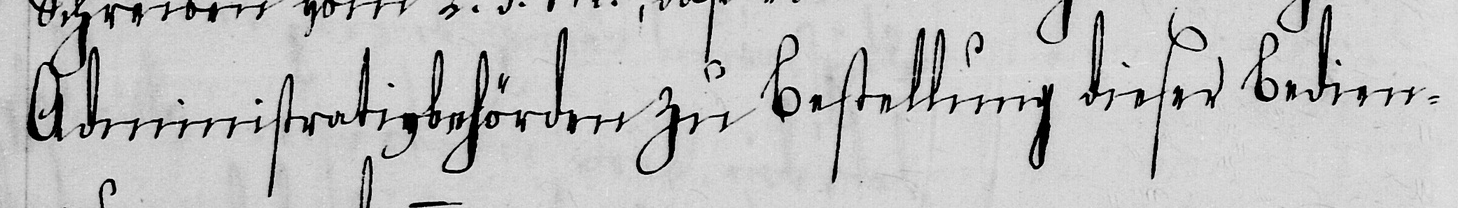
Administrativbehörden zu Bestellung dieser Bedien¬
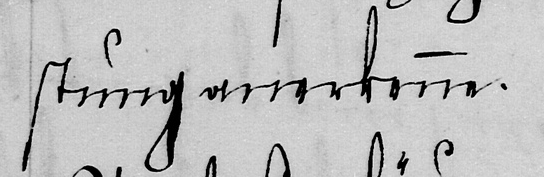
stung anerkenne.
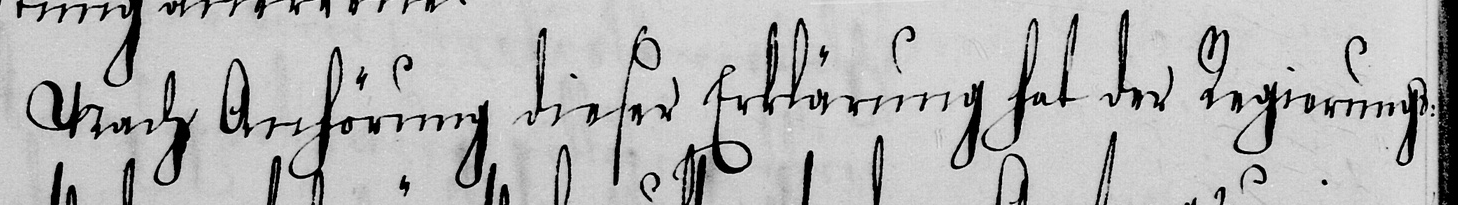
Nach Anhörung dieser Erklärung hat der Regierung¬
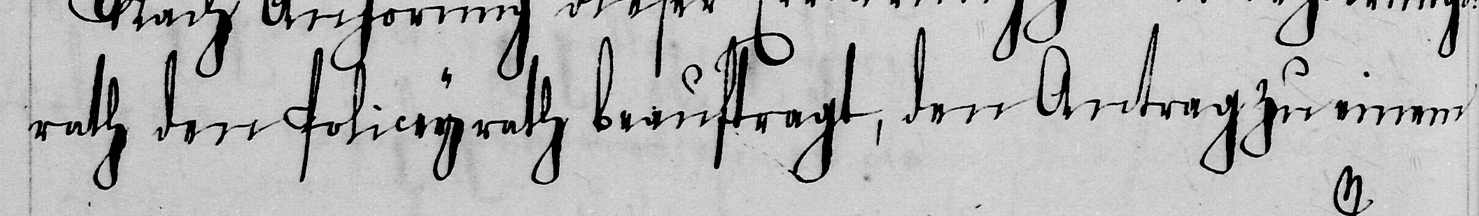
srath den Policeyrath beauftragt, den Antrag zu einem
